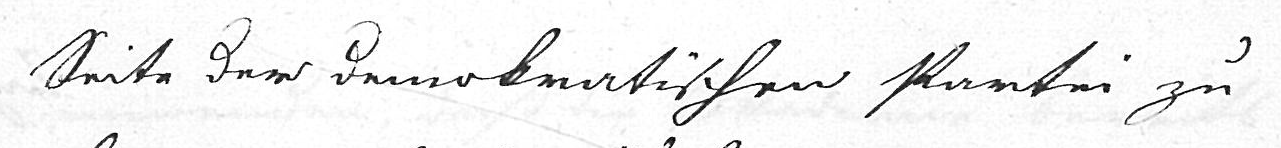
Seite der demokratischen Partei zu
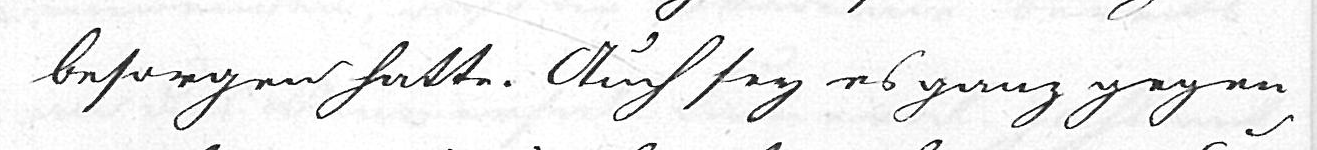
besorgen hatte. Auch sey es ganz gegen
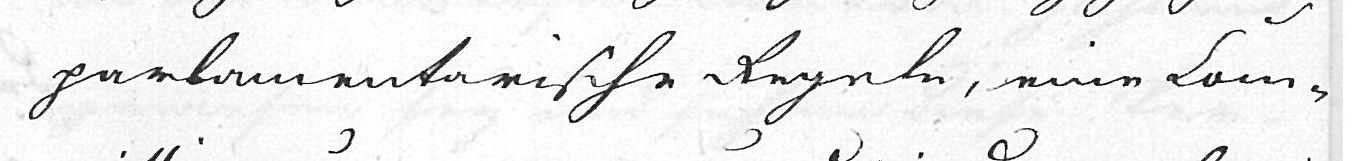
parlamentarische Regeln, eine Com-
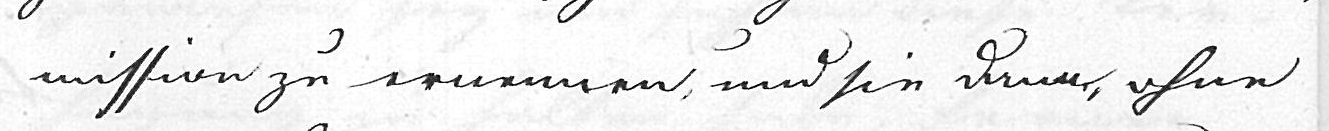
mission zu ernennen, und sie dann, ohne
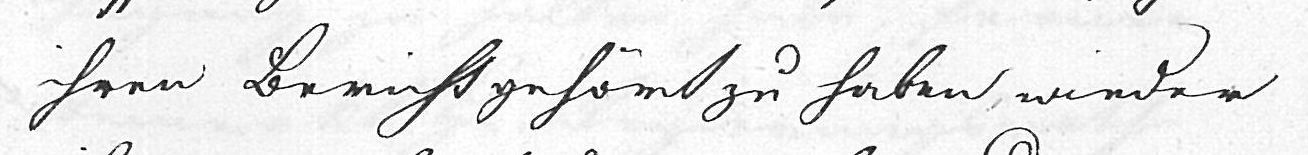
ihren Bericht gehört zu haben, wieder
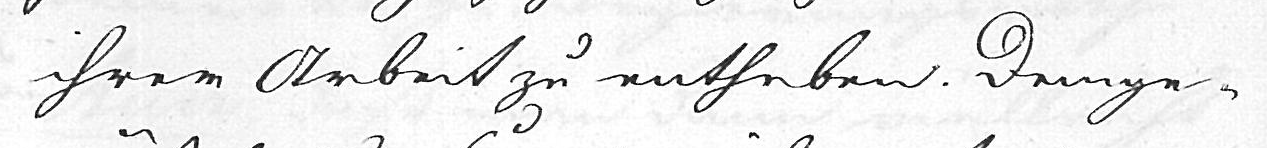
ihrer Arbeit zu entheben. Demge-
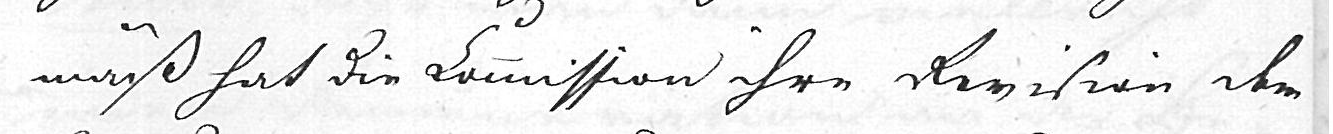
mäß hat die Commission ihre Revision der
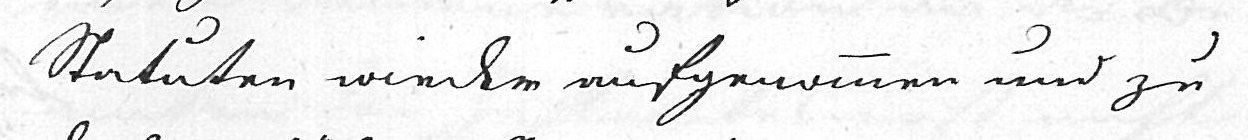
Statuten wieder aufgenommen und zu
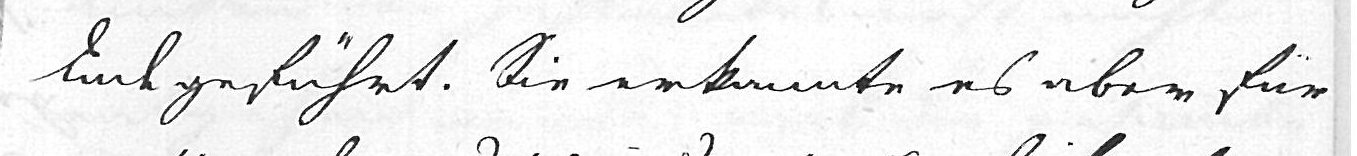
Ende geführt. Sie erkannte es aber für
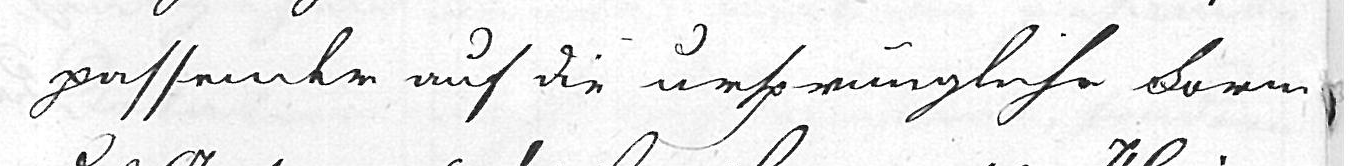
passender auf die urspüngliche Form
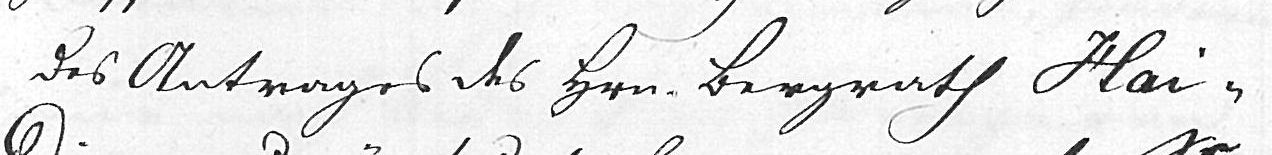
des Antrage des Hrn. Bergrath Hai-
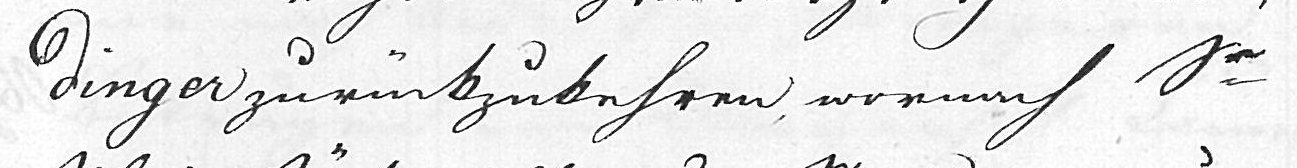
dinger zurückzukehren, wornach Sr
